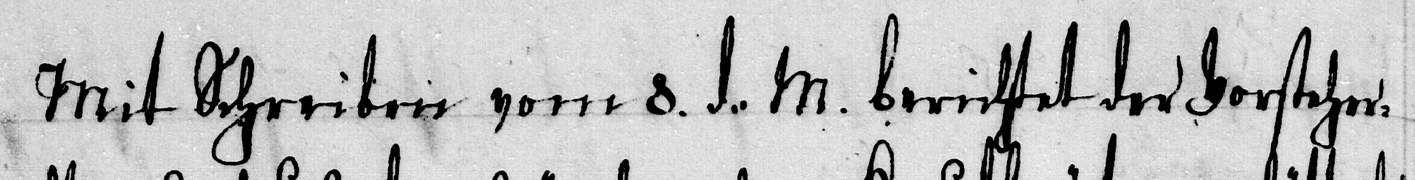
Mit Schreiben vom 8. d. M. berichtet der Vorsteher¬
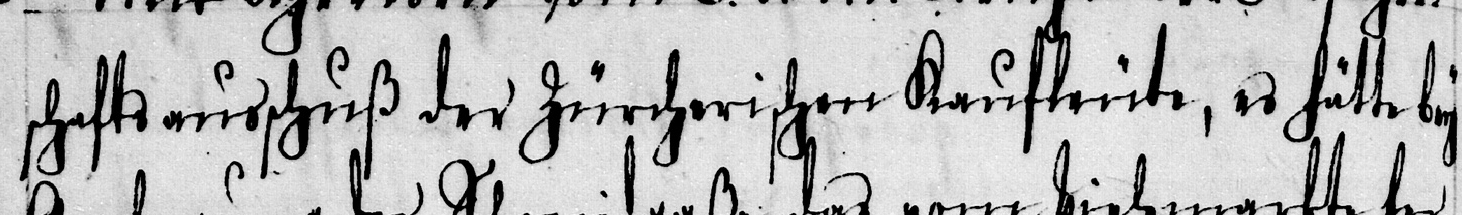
schaftsausschuß der Zürcherischen Kaufleute, es hätte
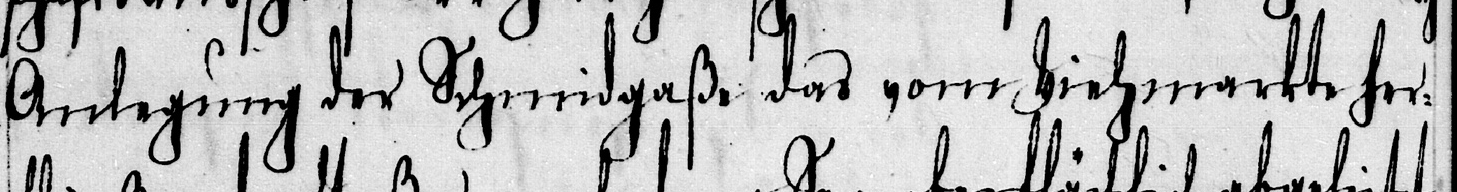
Anlegung der Schmidgaße das vom Viehmarkte her¬
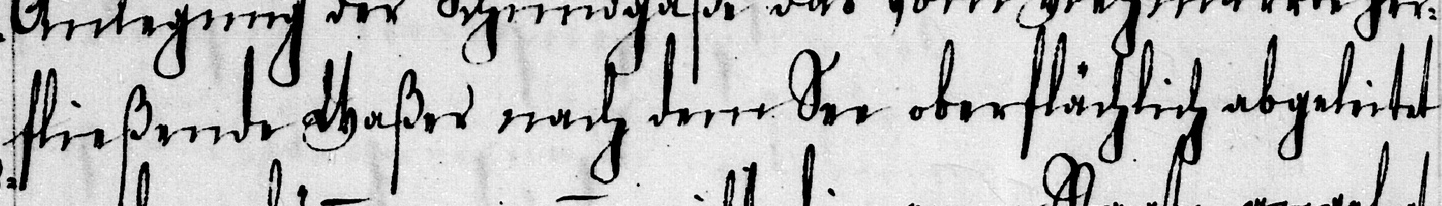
fließende Waßer nach dem See oberflächlich abgeleitet
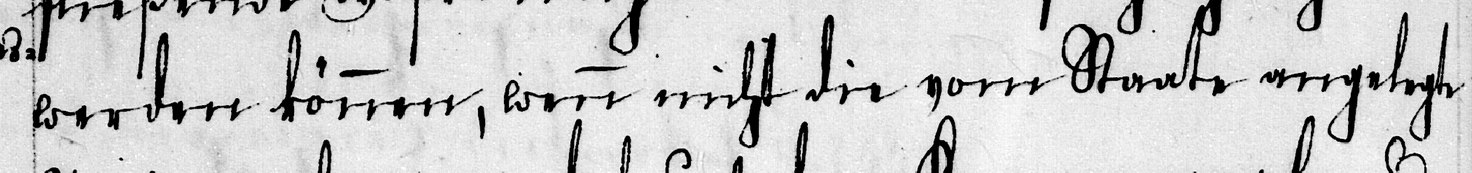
werden können, wenn nicht die vom Staate angelegte
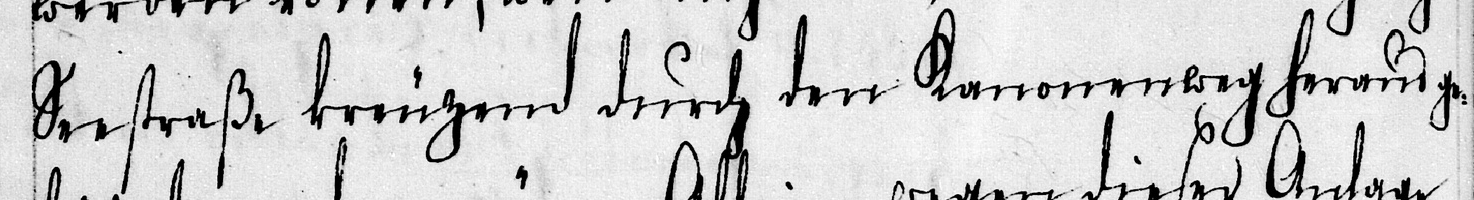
Seestraße kreuzend durch den Kanonenweg heraus
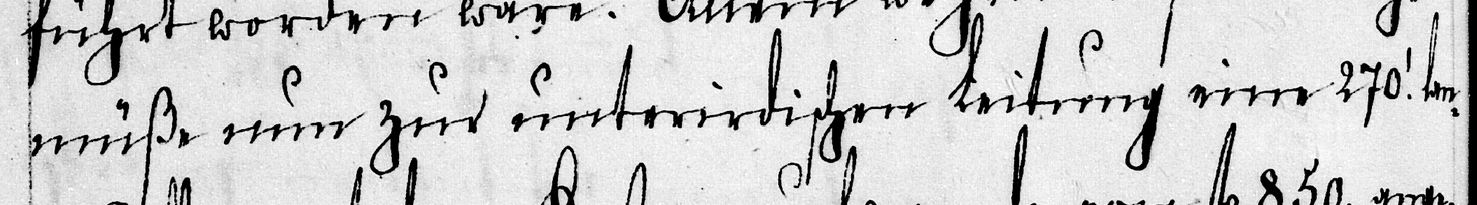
müße nun zur unterirdischen Leitung eine 270’. la¬
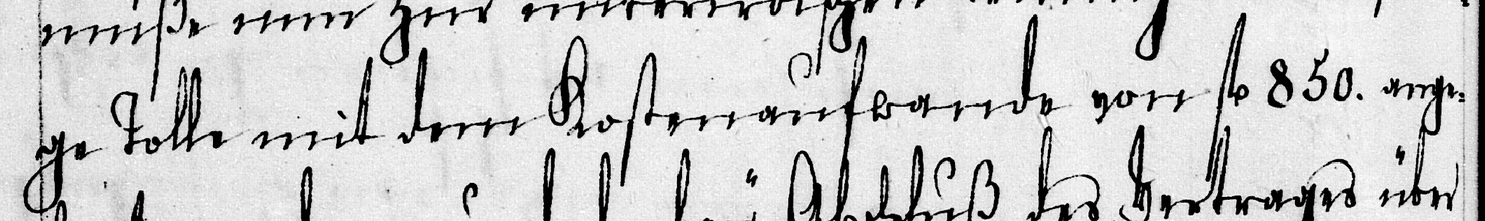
nge Tolle mit dem Kostenaufwande von fl. 850. ang¬
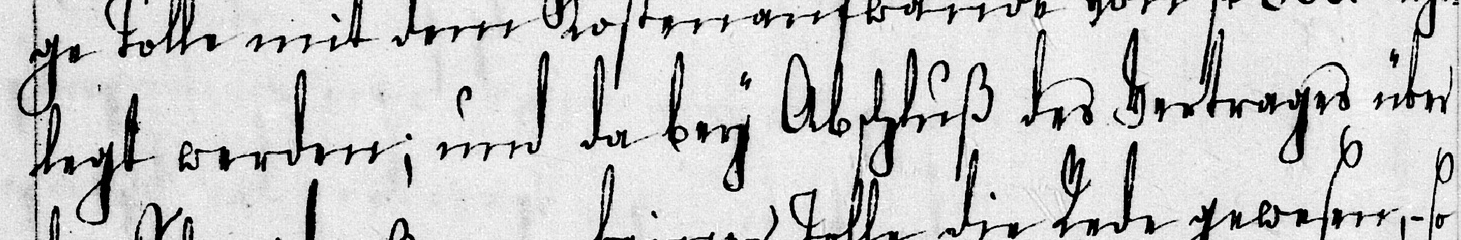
elegt werden; und da bey Abschluß des Vertrages über
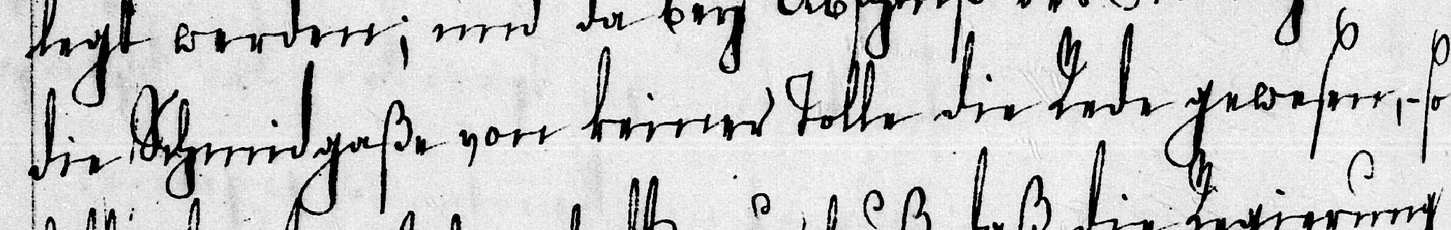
die Schmidgaße von keiner Tolle die Rede gewesen, –
